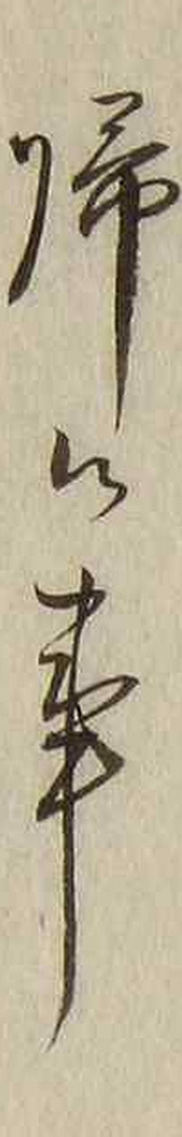帰候事
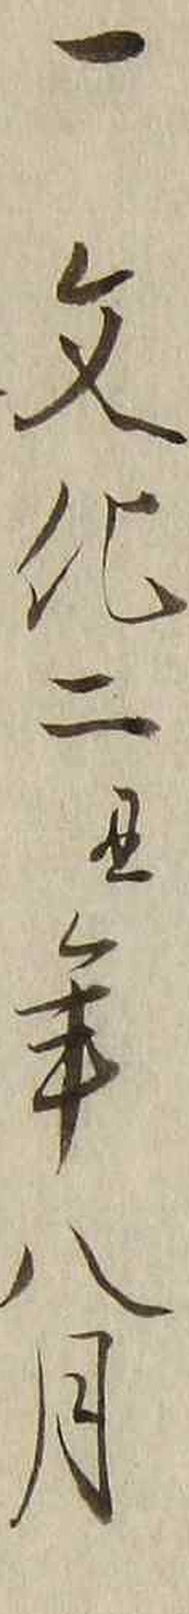一文化二丑年八月
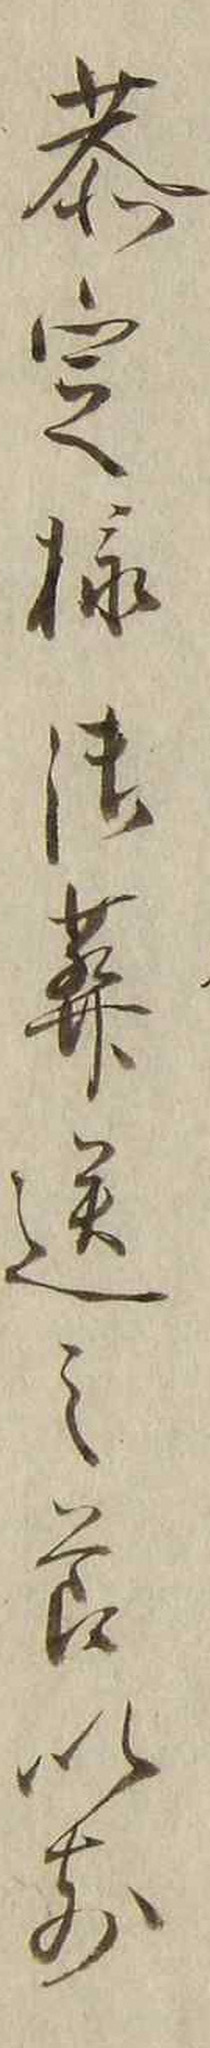恭定様御葬送之節以前

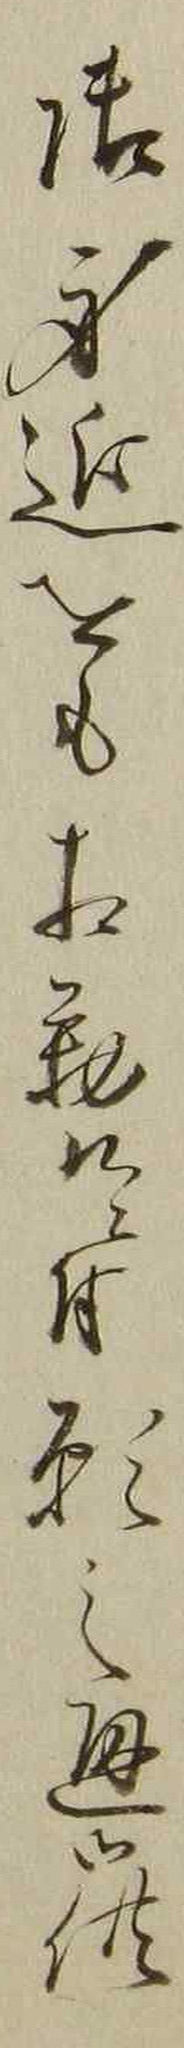御身近をも相勤候に付願之通御供
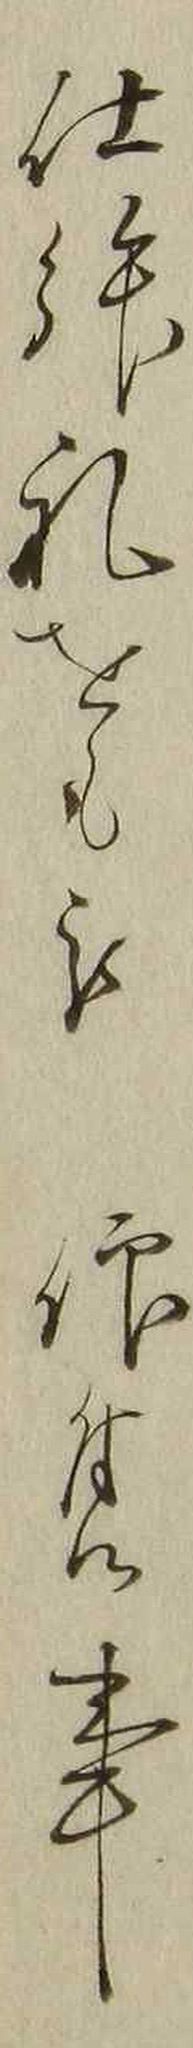仕拝礼をも被仰付候事
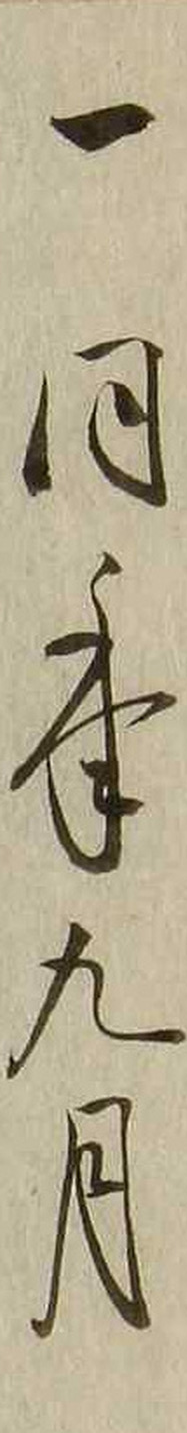一同年九月
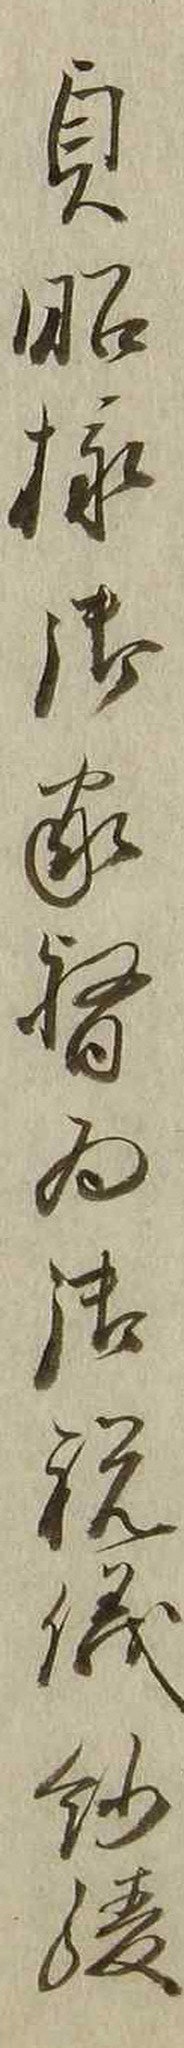貞昭様御為御祝儀紗綾
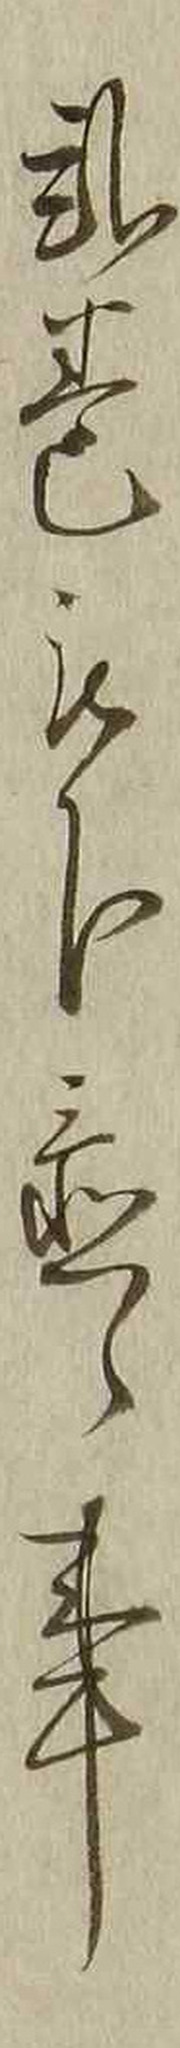弐巻被下置候事
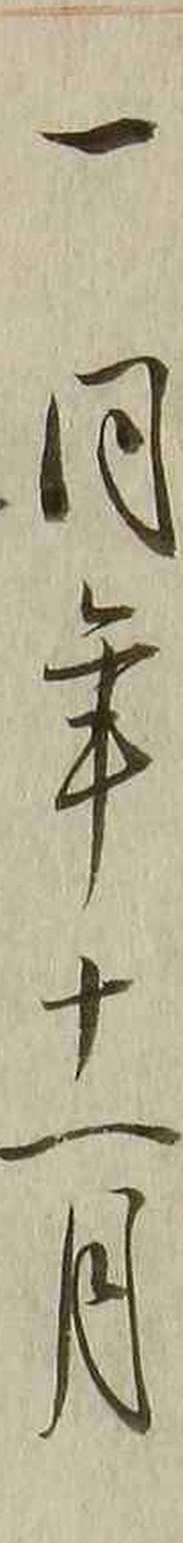一同年十一月
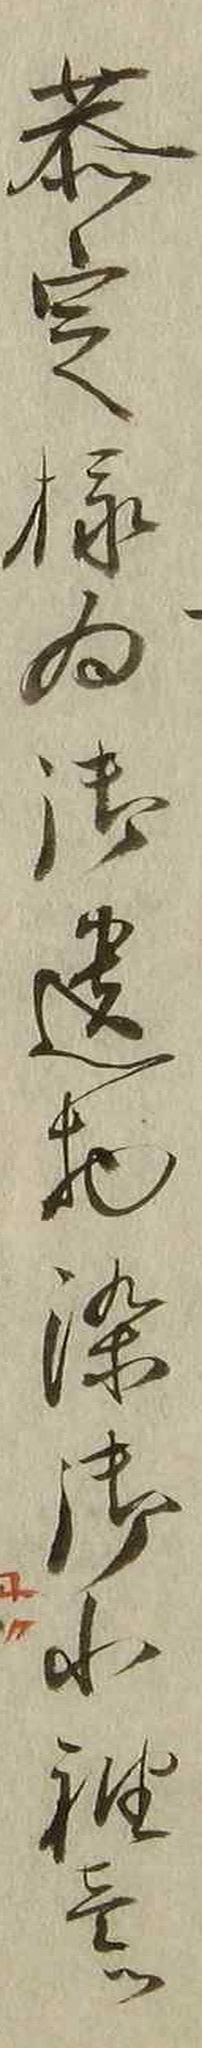恭定様為御遺物染御小袖壱つ
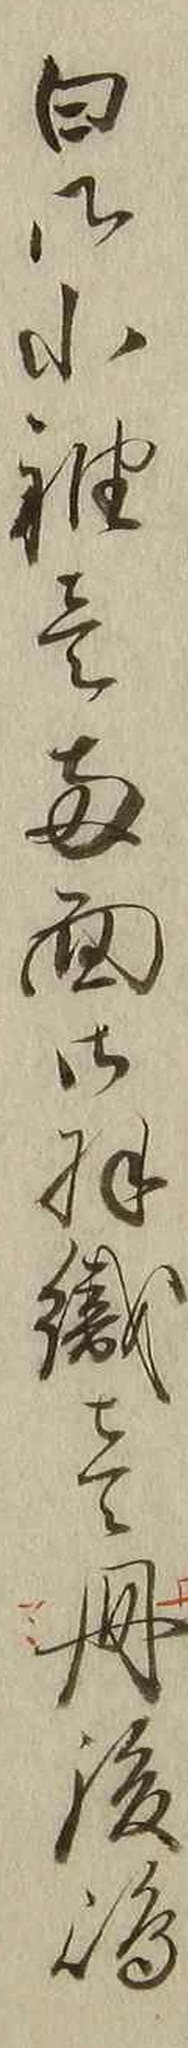白御小袖壱両面御羽織にて丹後嶋
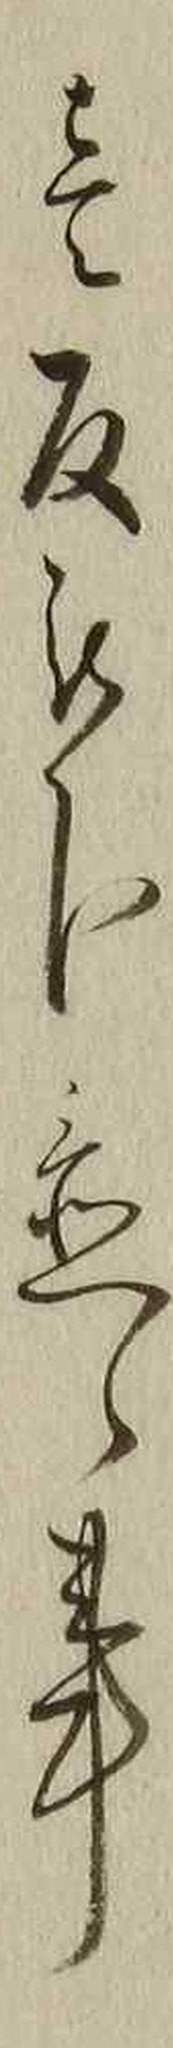壱反被下置候事
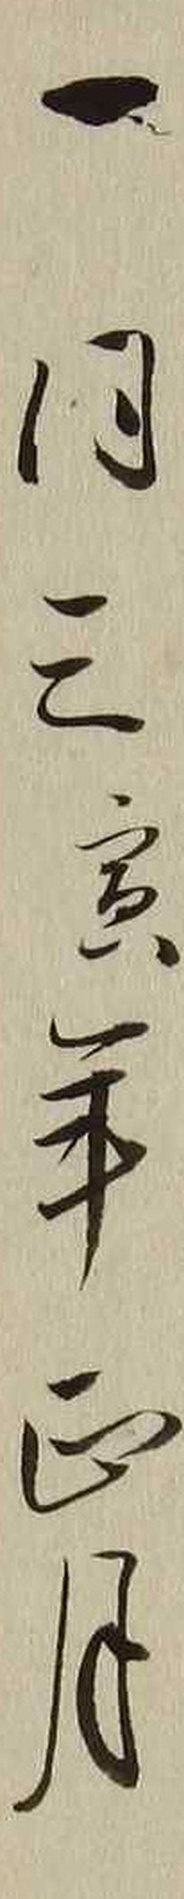一同三寅年正月
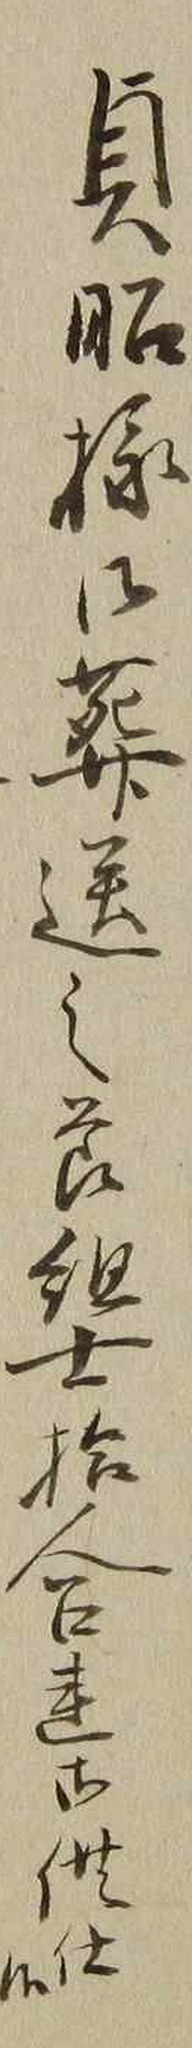貞昭様御葬送之節組士拾人召連御供仕候
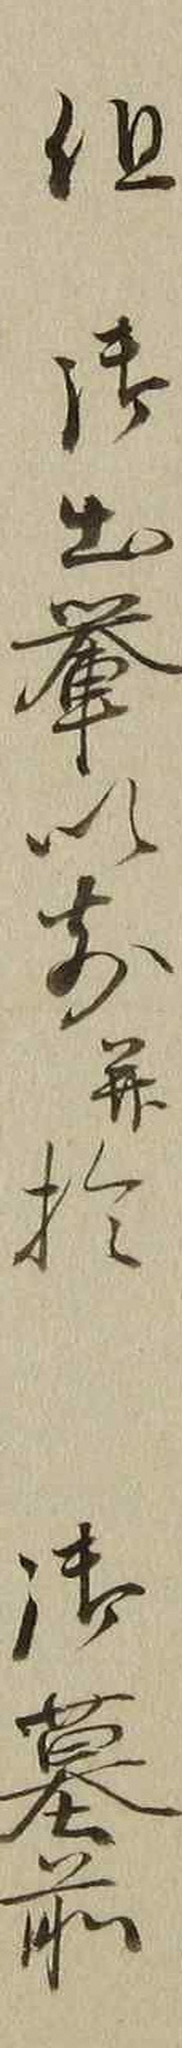但御出輂以前并於御墓前
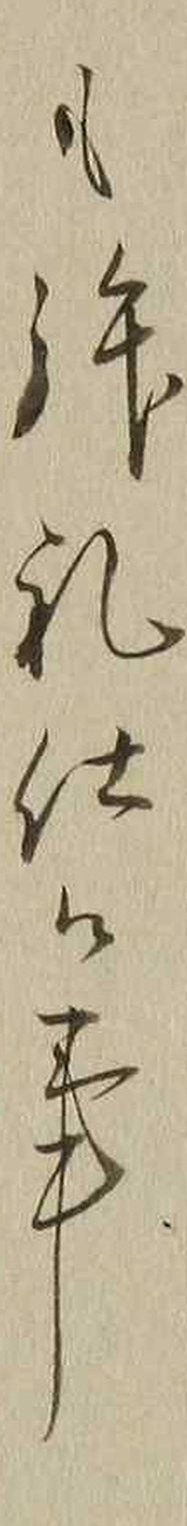も拝礼仕候事
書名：諸士系譜　巻之103　か之部11
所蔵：会津若松市立会津図書館
